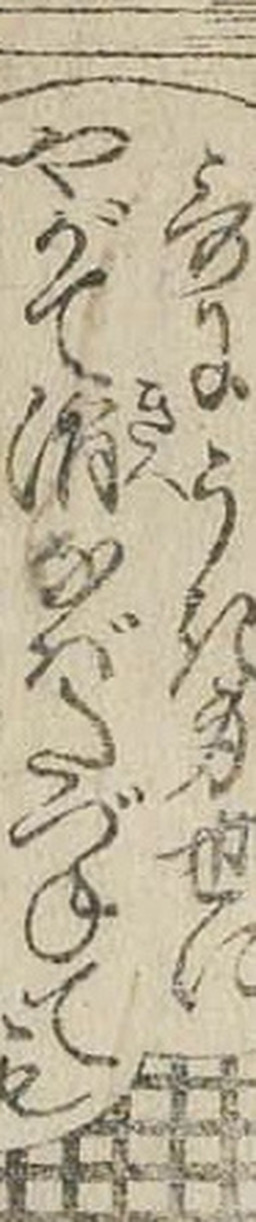やがて消なばたづねても
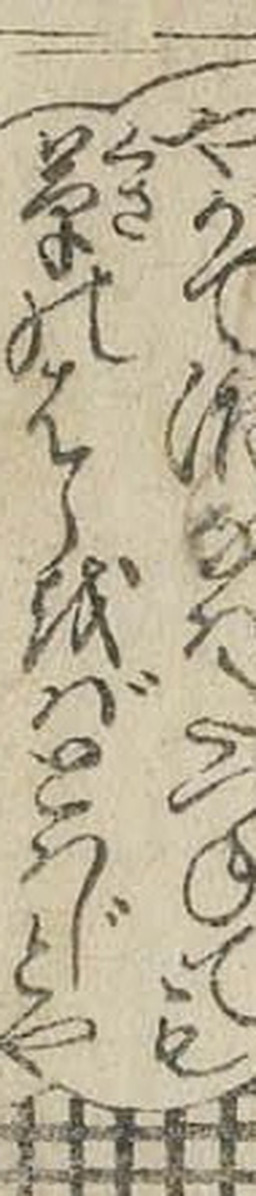草のはらをばとはじとや
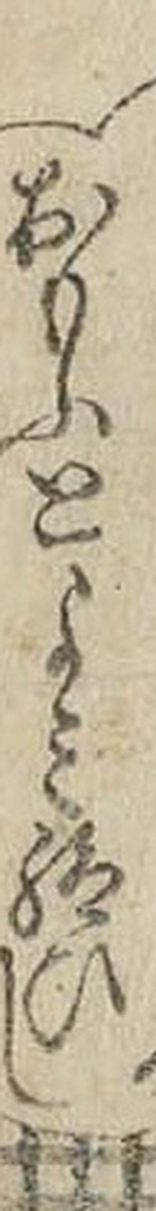おもふとよみ給ひし
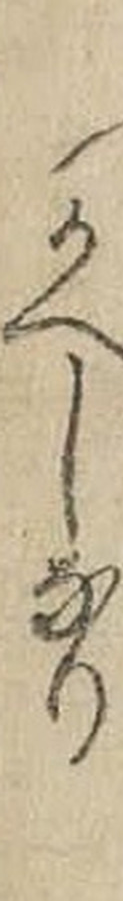かへしなり

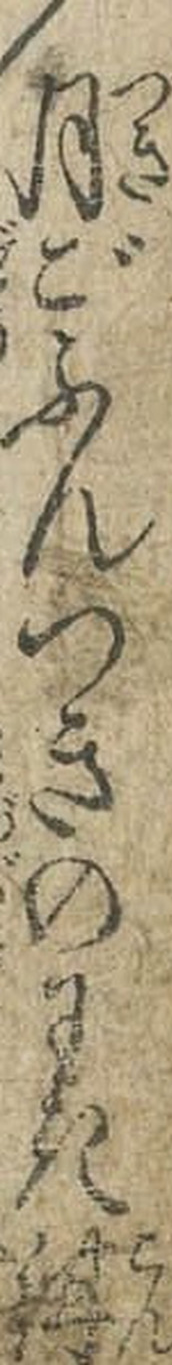月ごふんつきのわき紺
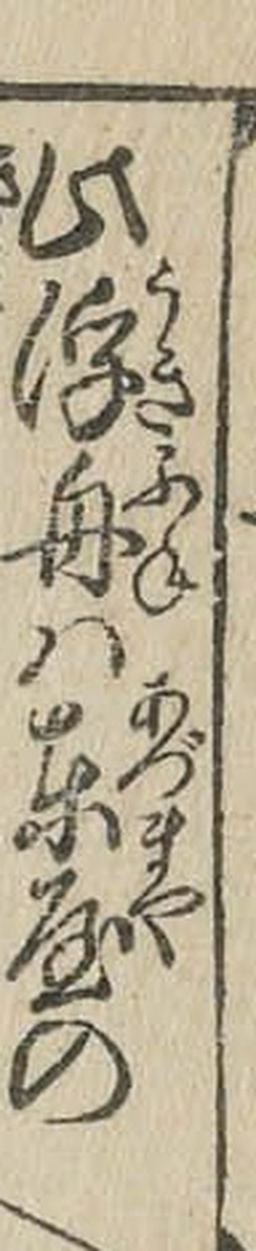此浮舟は東屋の
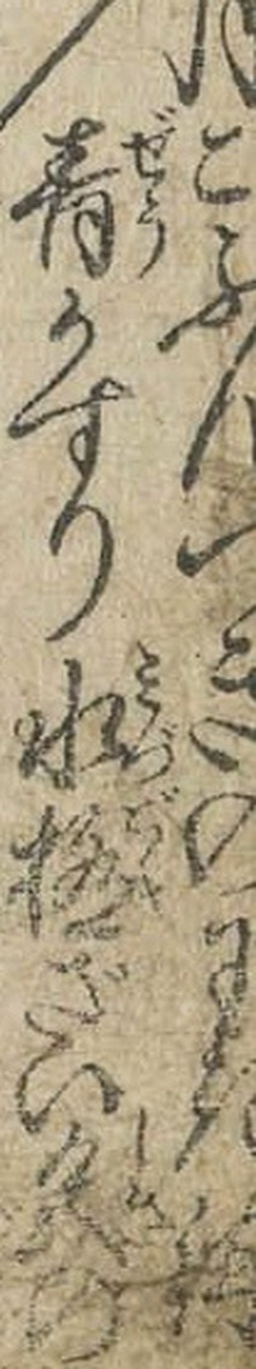青かすり水極ざい色の
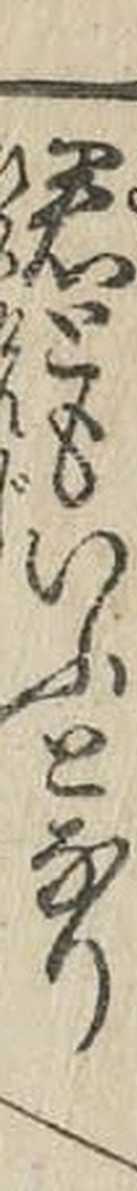君ともいふとなり
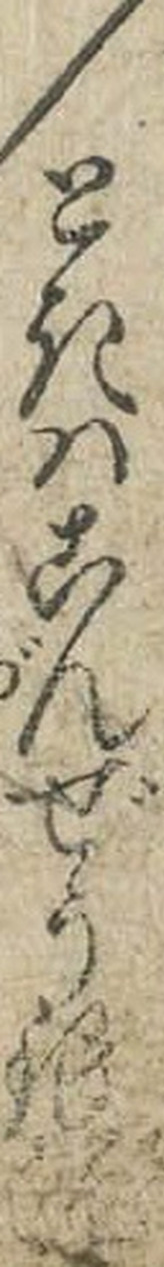ときはこんぜう銀泥
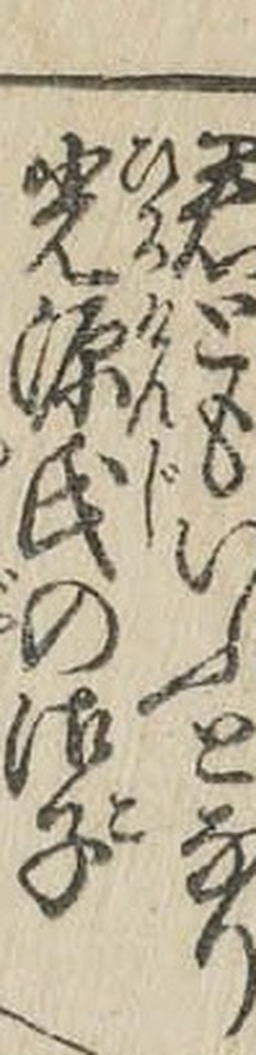光源氏の御子
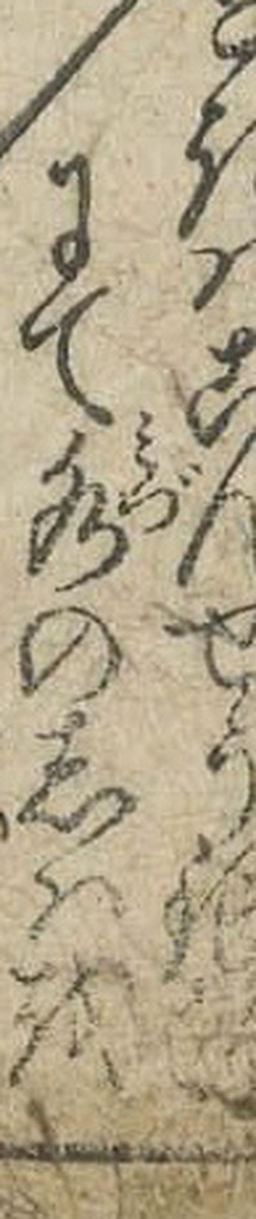にて水のしはを
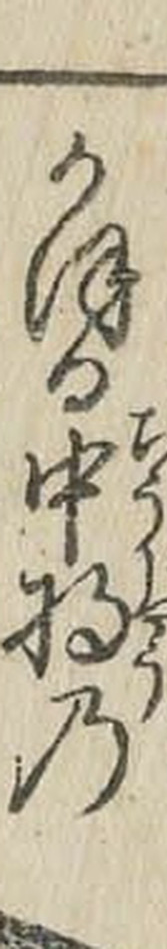かほる中将の
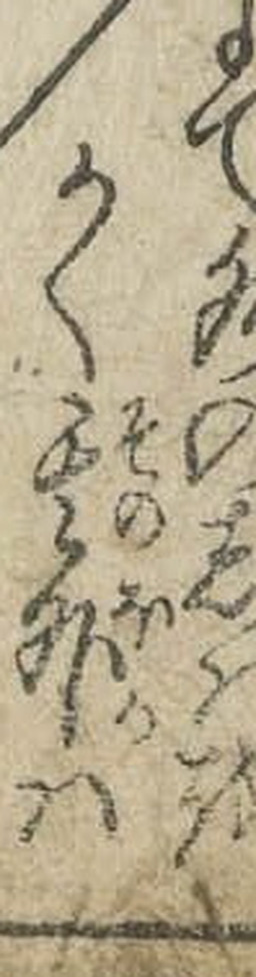かく其外は
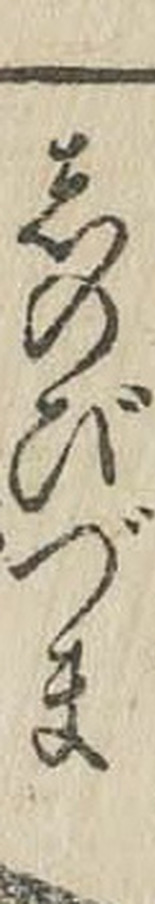しのびづま
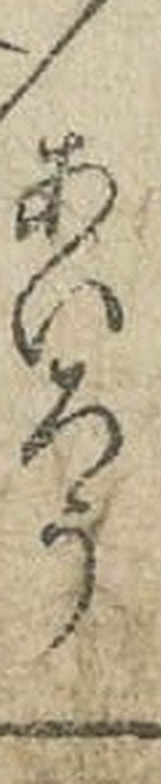あいろう
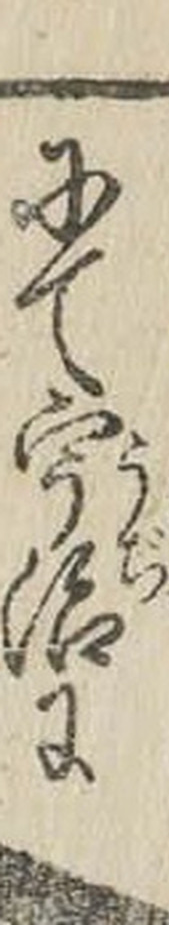にて宇治に
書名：絵本写宝袋 9巻 1之巻
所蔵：東京学芸大学教育コンテンツアーカイブ
